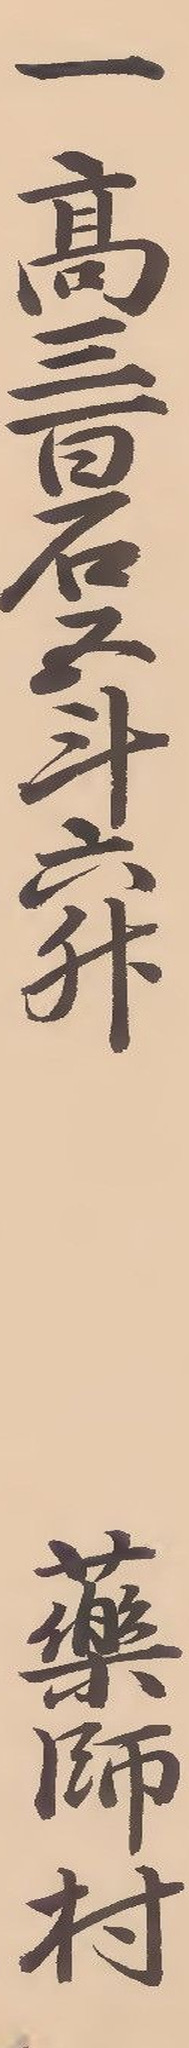一高三百石五斗六升薬師村

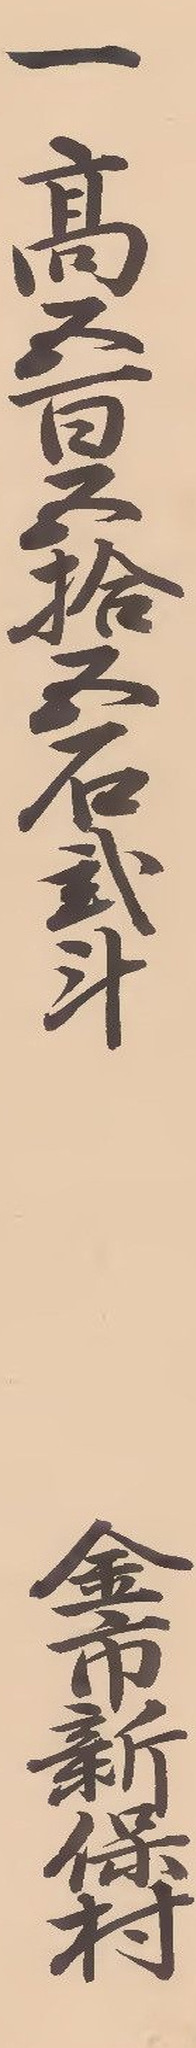一高五百五拾五石弐斗金市新保村
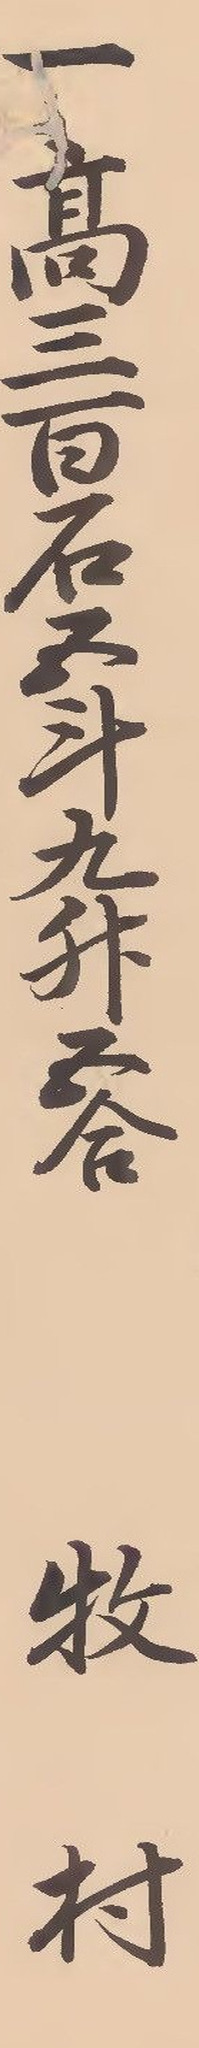一高三百石五斗九升五合牧村
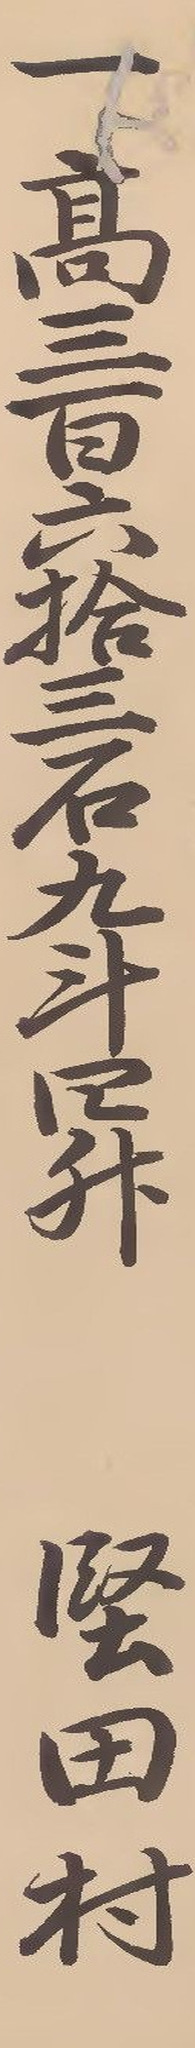一高三百六拾三石九斗四升堅田村
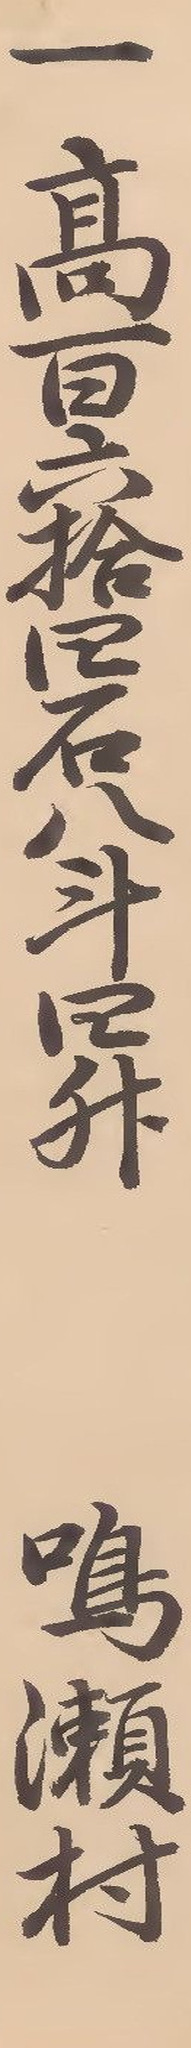一高百六拾四石八斗四升鳴瀬村

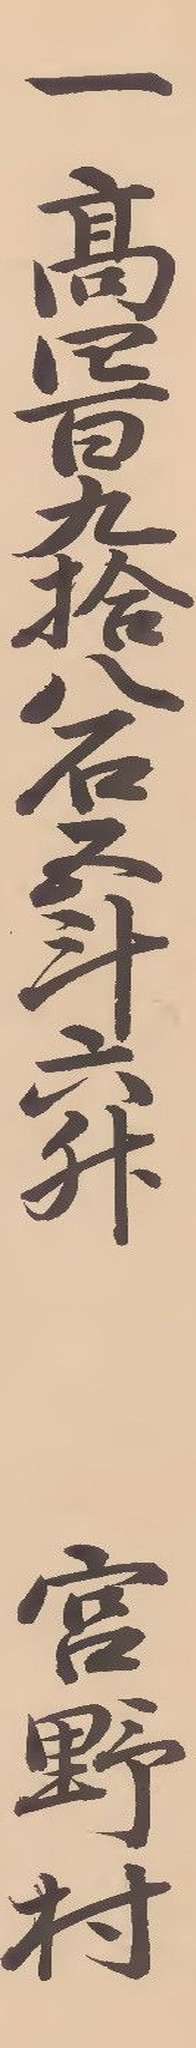一高四百九拾八石五斗六升宮野村
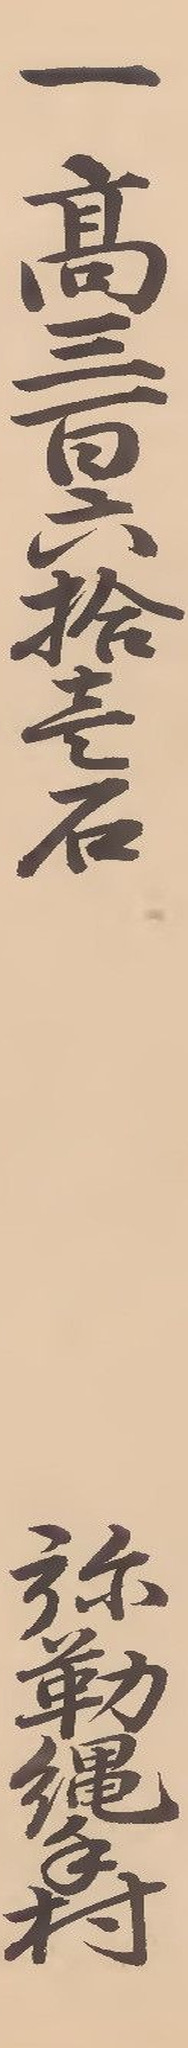一高三百六拾壱石弥勒繩手村
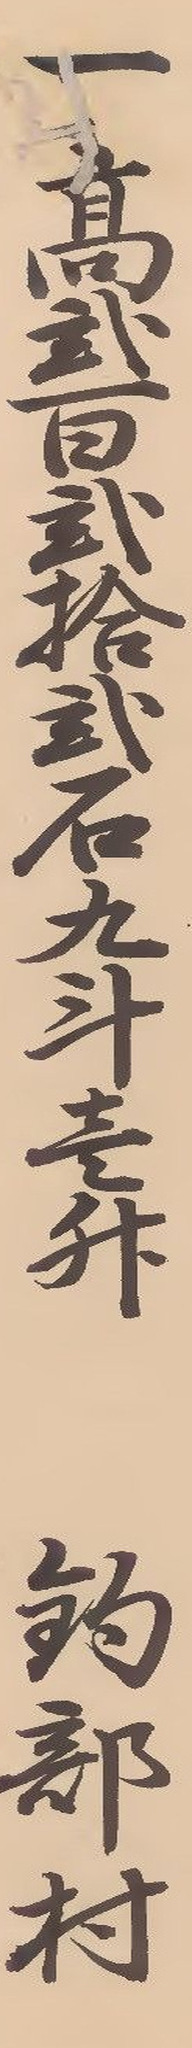一高弐百弐拾弐石九斗壱升釣部村
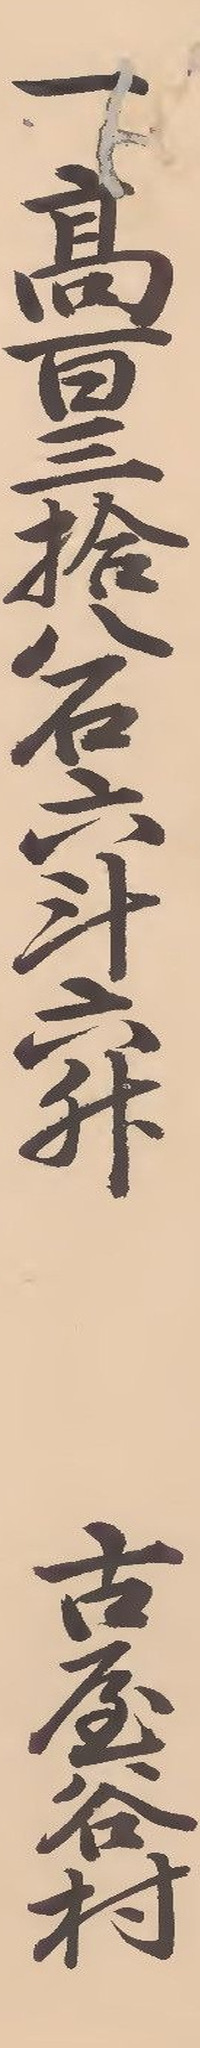一高百三拾八石六斗六升古屋谷村
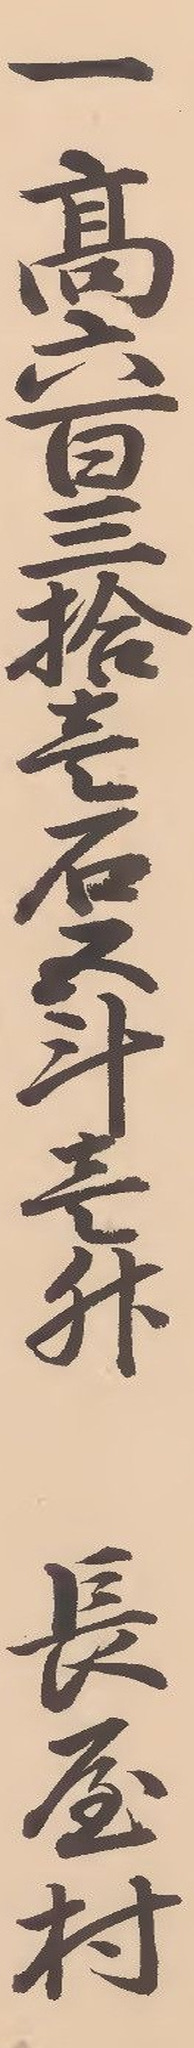一高六百三拾壱石五斗壱升長屋村
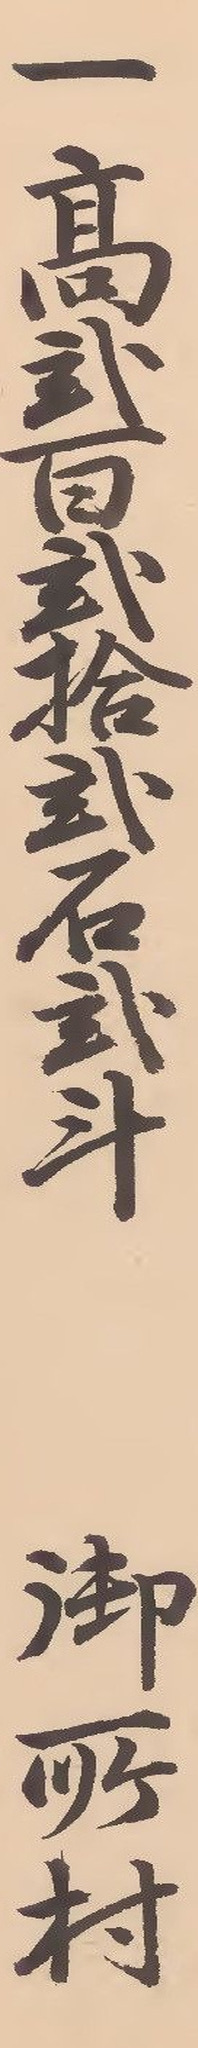一高弐百弐拾弐石弐斗御所村

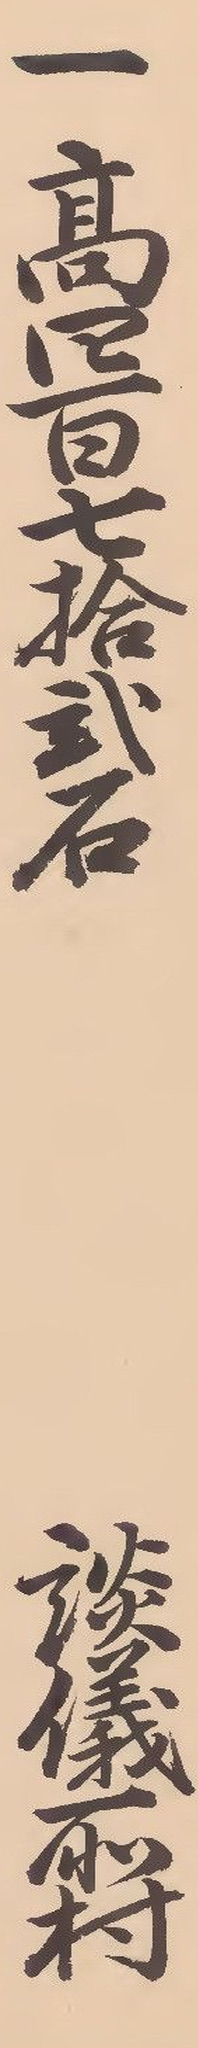一高四百七拾弐石談儀所村
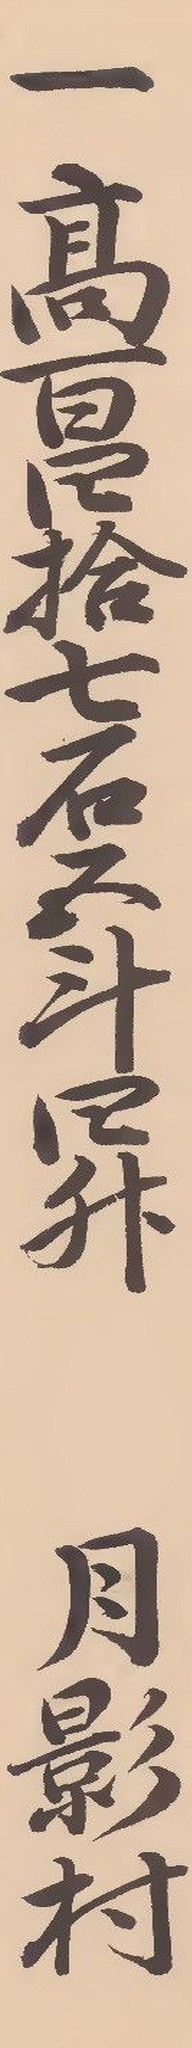一高百四拾七石五斗四升月影村
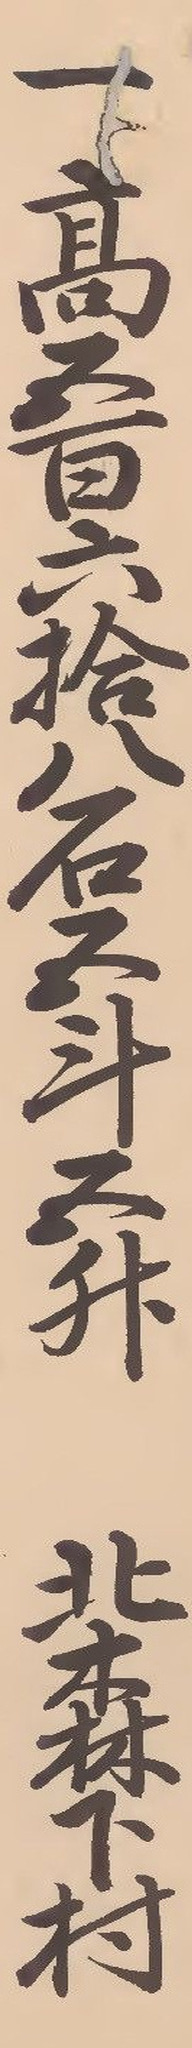一高五百六拾八石五斗五升北森下村
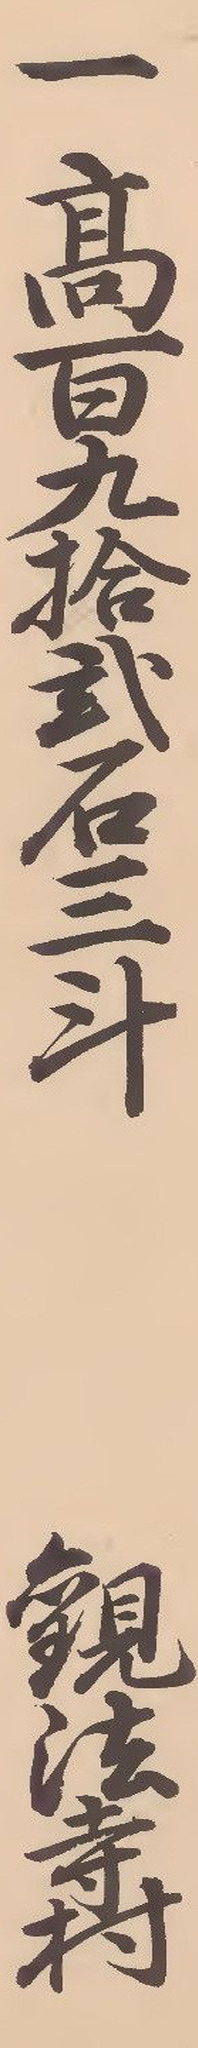一高百九拾弐石三斗観法寺村

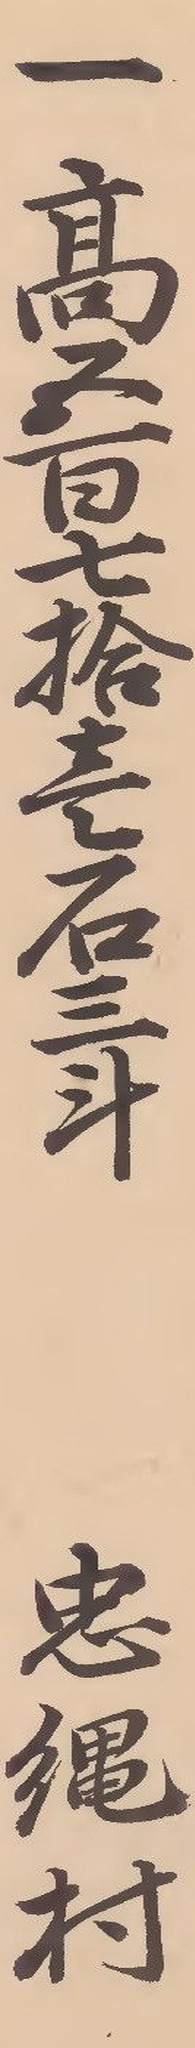一高五百七拾壱石三斗忠縄村
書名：加賀国郷帳
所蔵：国立公文書館 National Archives of Japan
